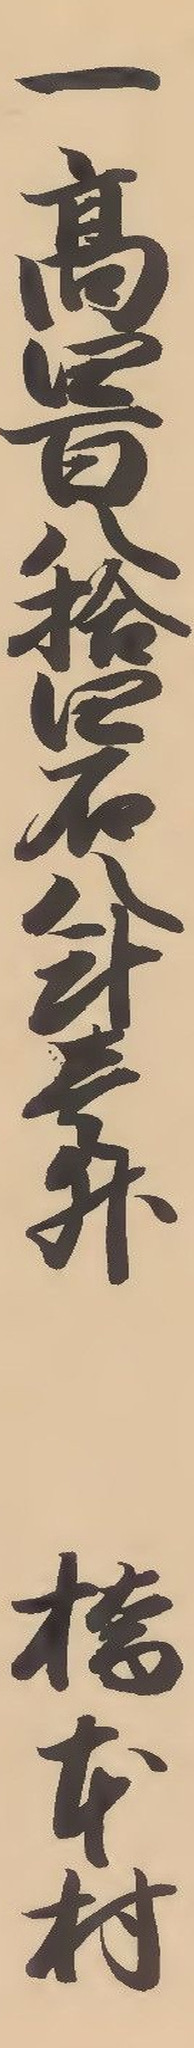一高四百八拾四石八斗壱升橋本村
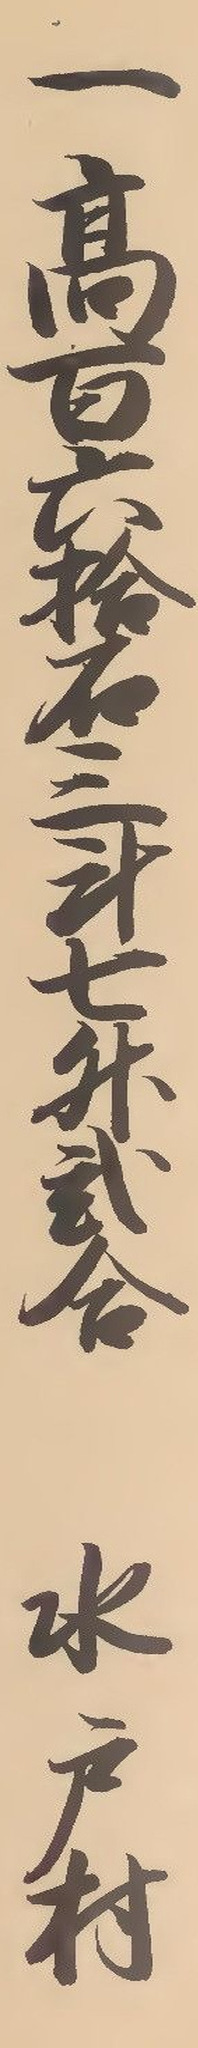一高百六拾石三斗七升弐合水戸村
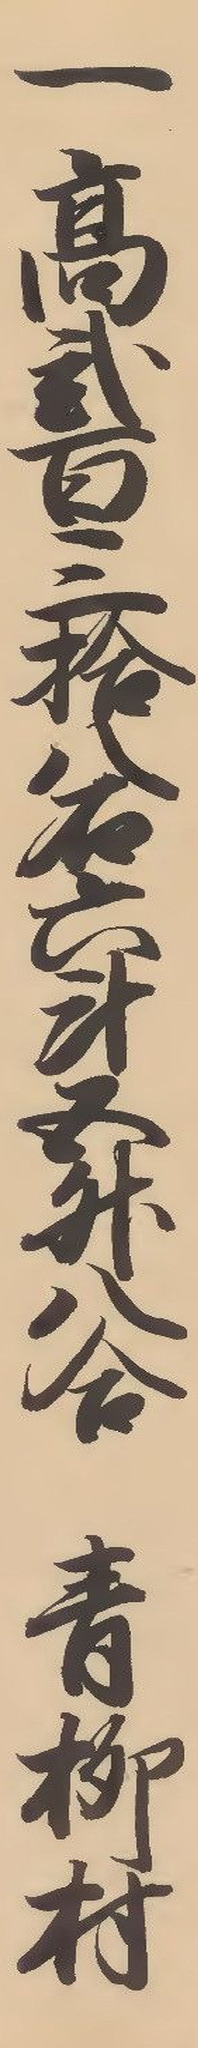一高弐百三拾八石六斗五升八合青柳村
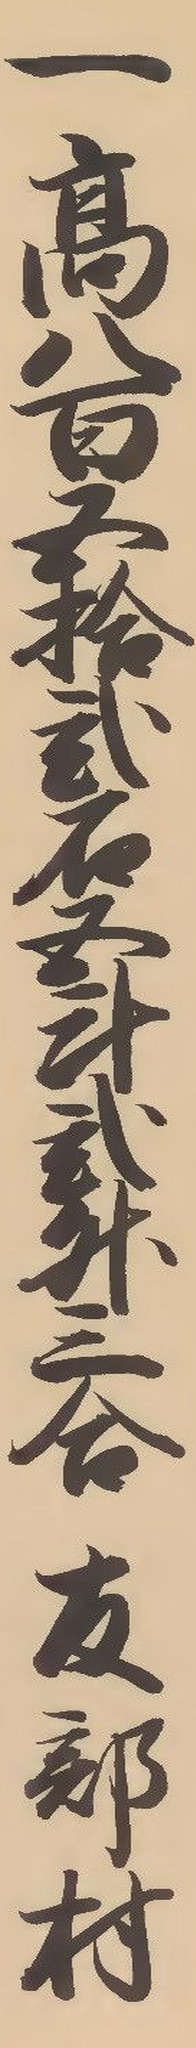一高八百五拾弐石五斗弐升三合友部村
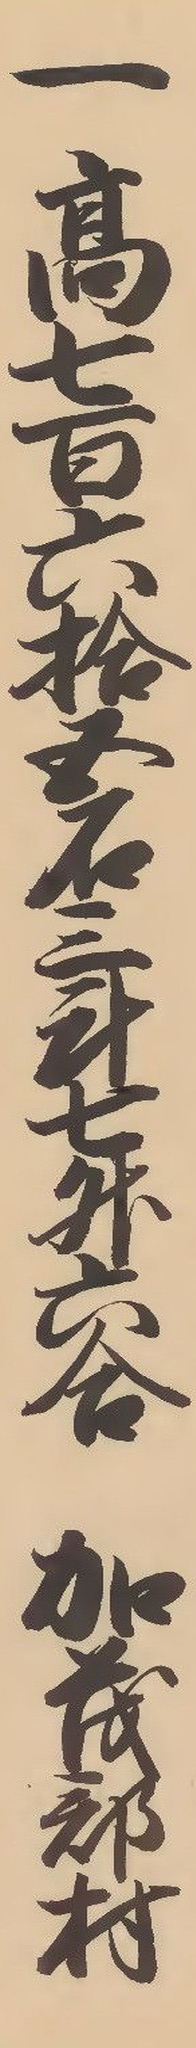一高七百六拾五石三斗七升六合加茂部村

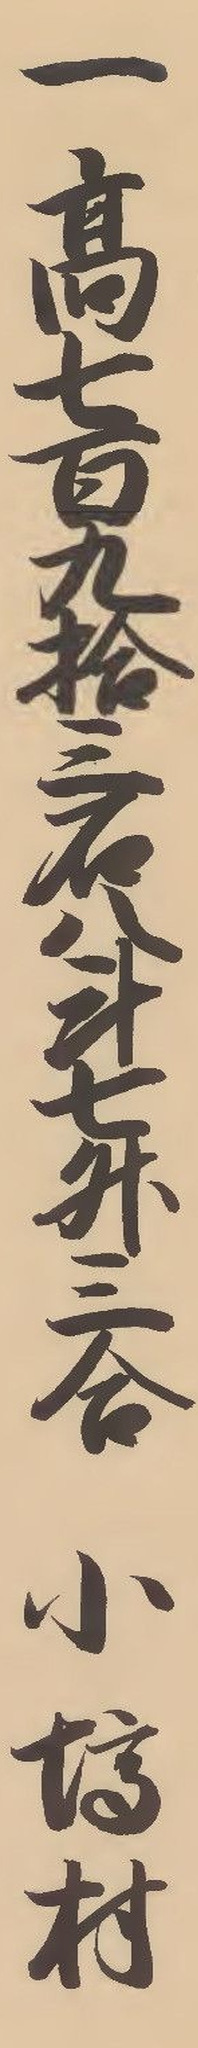一高七百九拾三石八斗七升三合小塙村
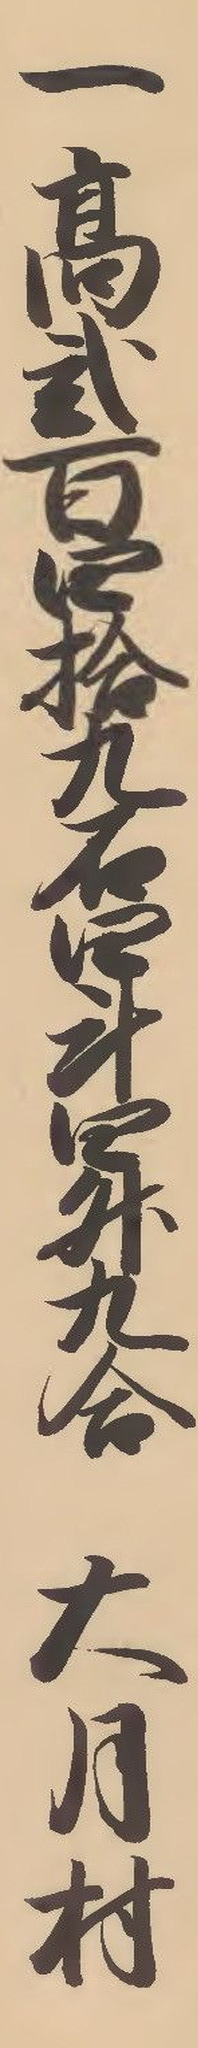一高弐百四拾九石四斗四升九合大月村
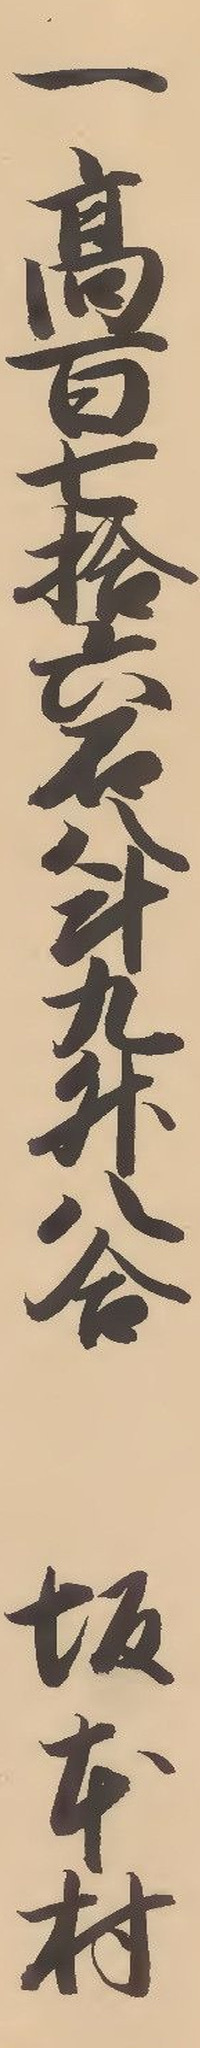一高百七拾六石八斗九升八合坂本村
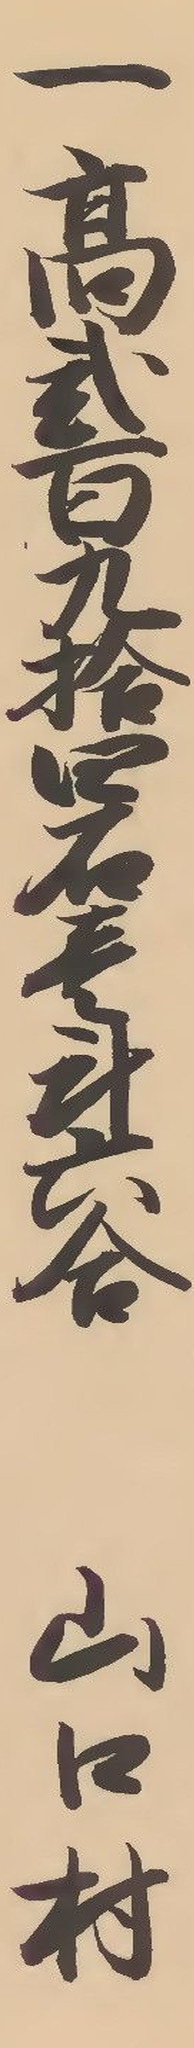一高弐百九拾四石壱斗六合山口村
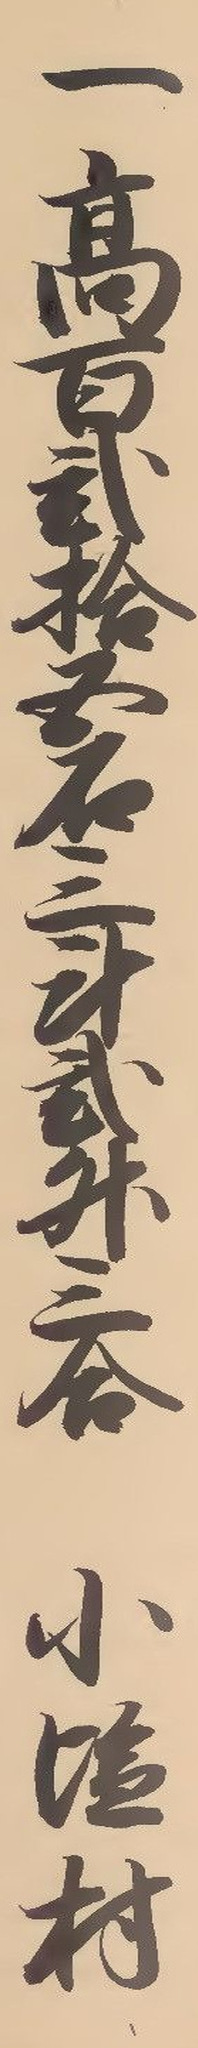一高百弐拾五石三斗弐升三合小塩村
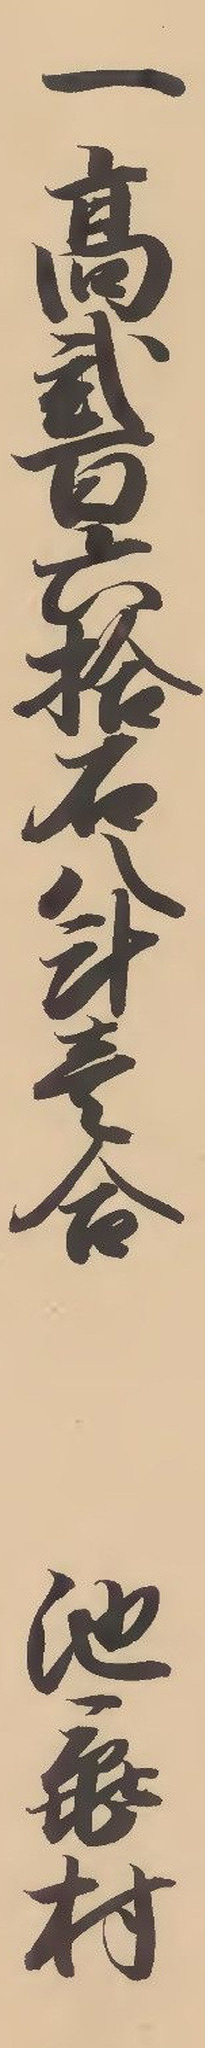一高弐百六拾石八斗壱合池亀村
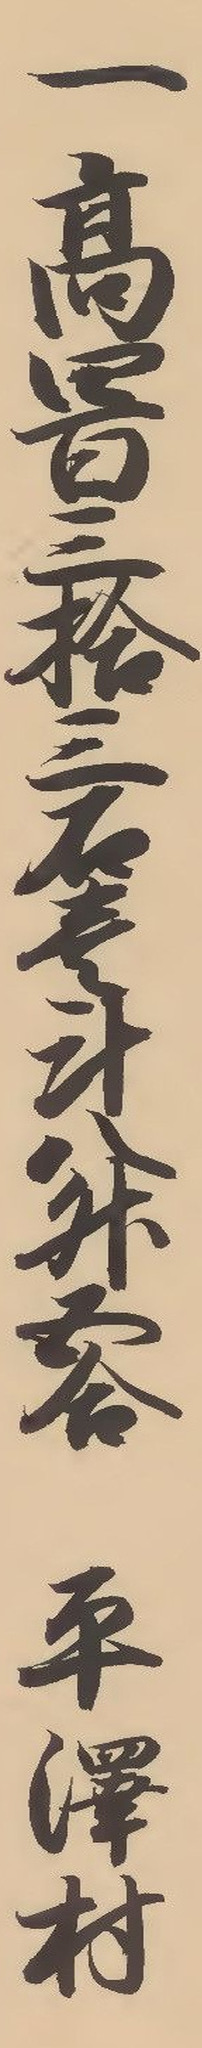一高四百三拾三石壱斗八升五合平沢村
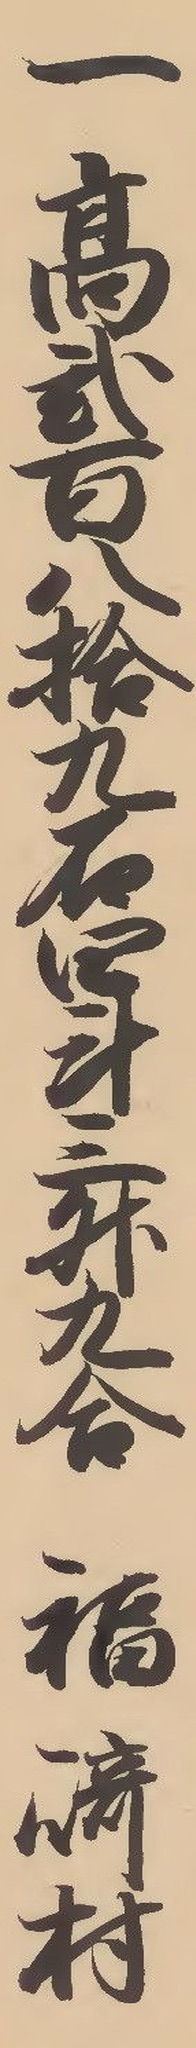一高弐百八拾九石四斗三升九合福崎村

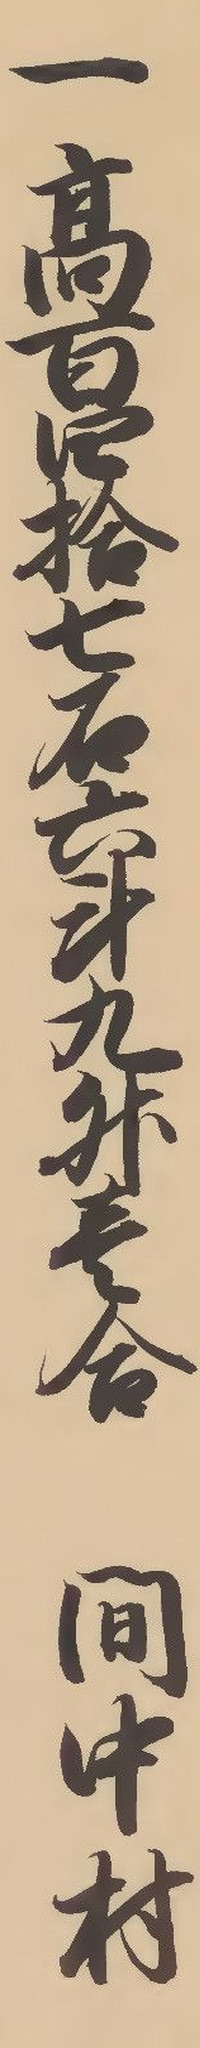一高百四拾七石六斗九升壱合間中村
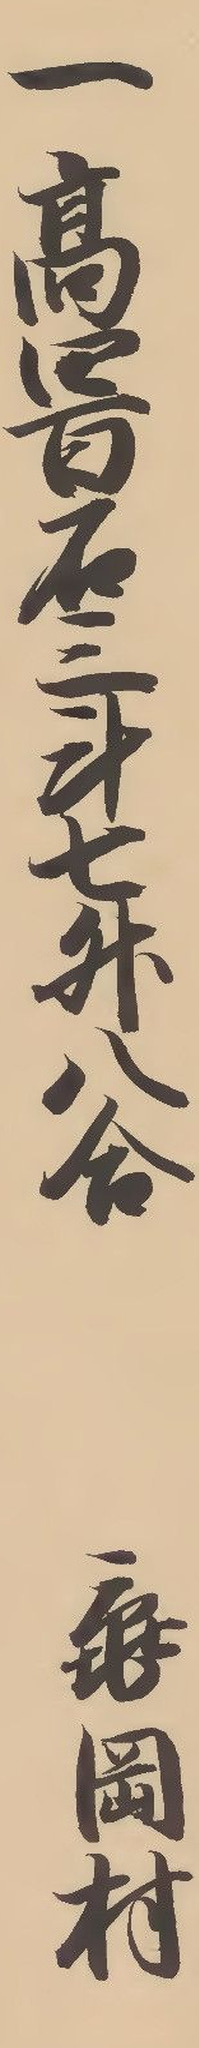一高四百石三斗七升八合亀岡村
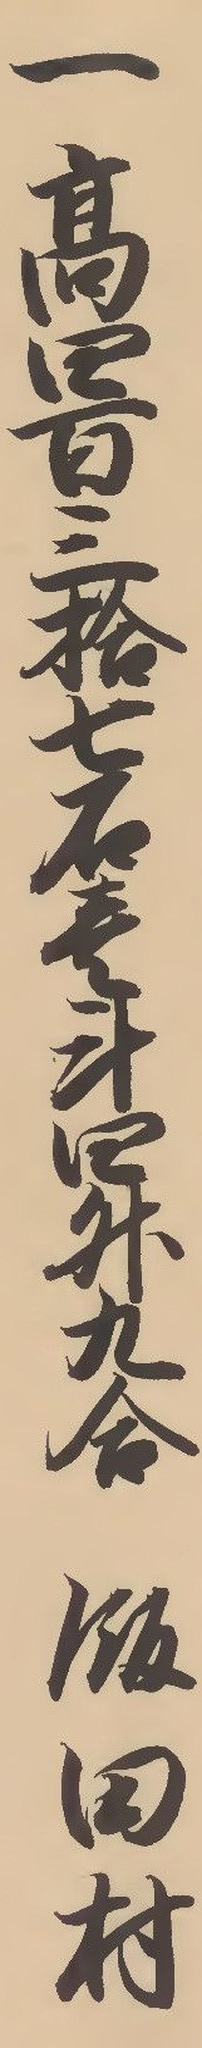一高四百三拾七石壱斗四升九合飯田村
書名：常陸国郷帳
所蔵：国立公文書館 National Archives of Japan
